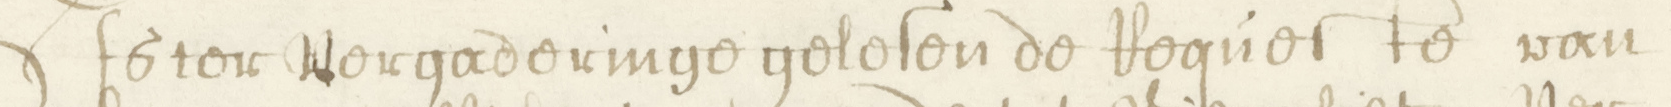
Is ter vergaderinge gelesen de Requeste van
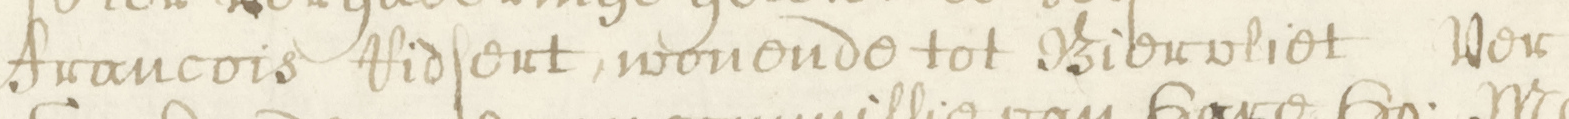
francois Ridsert, wonende tot Biervliet Ver
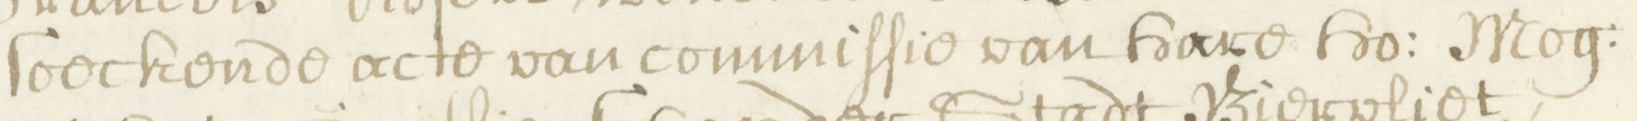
soeckende acte van commissie van hare Ho:Mog:
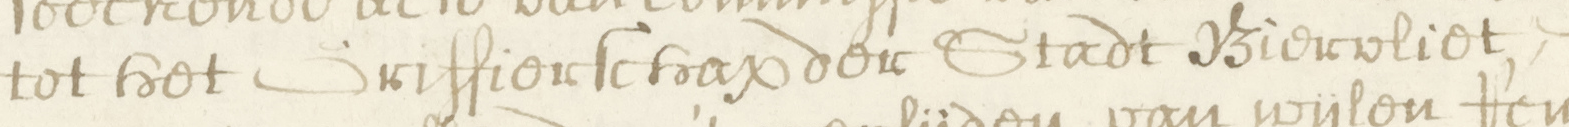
tot het Griffierschap der Stadt Biervliet,
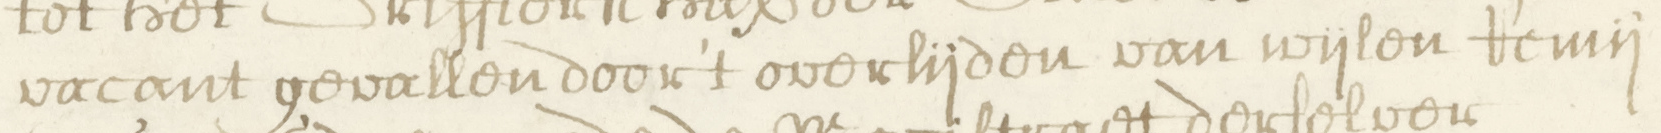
vacant gevallen door 't overlijden van wijlen Remij
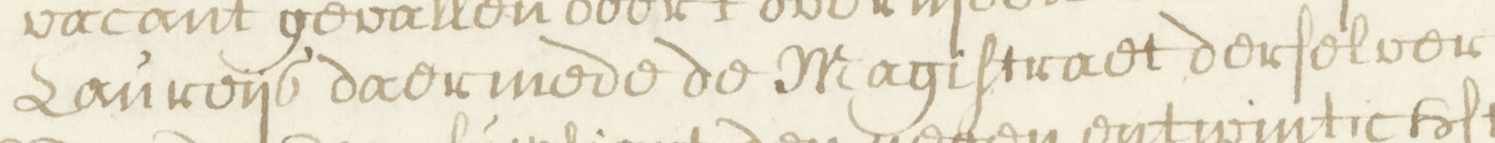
Laureijs daermede de Magistraet derselver
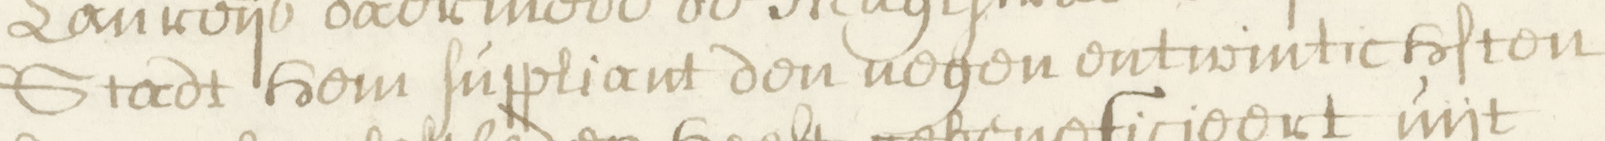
Stadt hem suppliant den negen entwintichsten
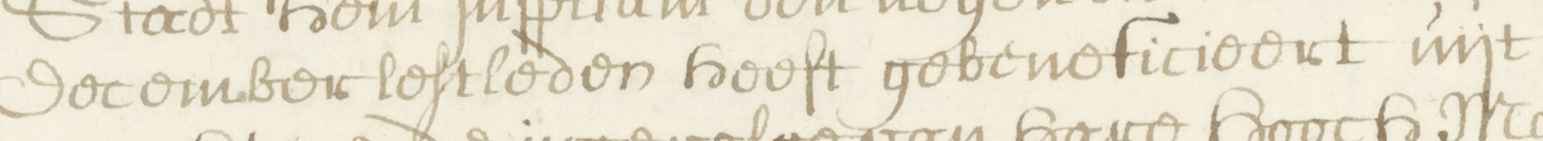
December lestleden heeft gebeneficieert uijt
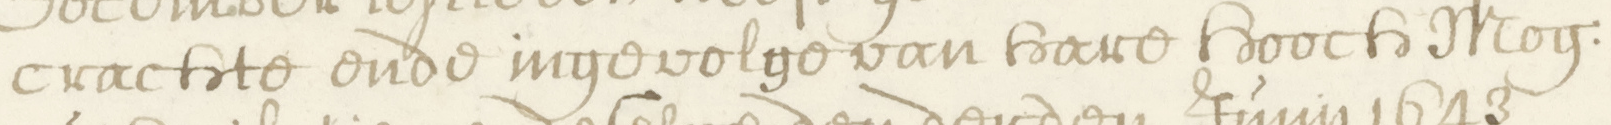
crachte ende ingevolge van hare Hooch Mog:
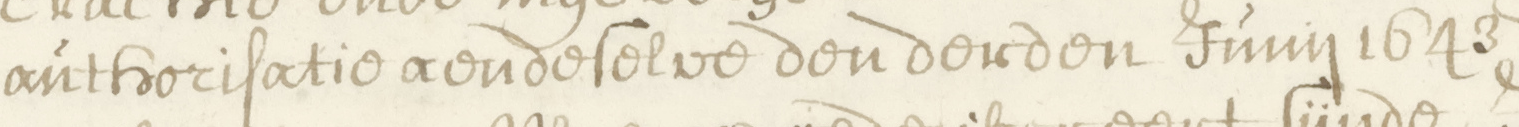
authorisatie aendeselve den derden Junij 1643
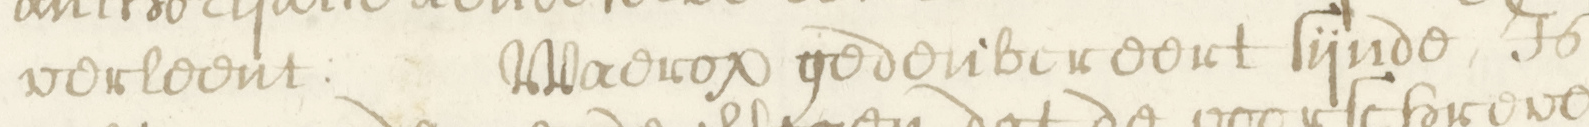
verleent: Waerop gedelibereert sijnde, Is
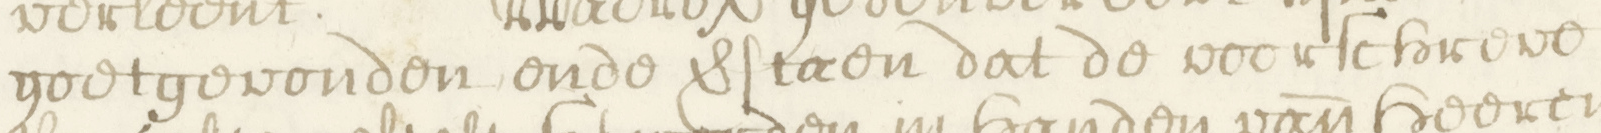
goetgevonden ende vstaen dat de voorschreve
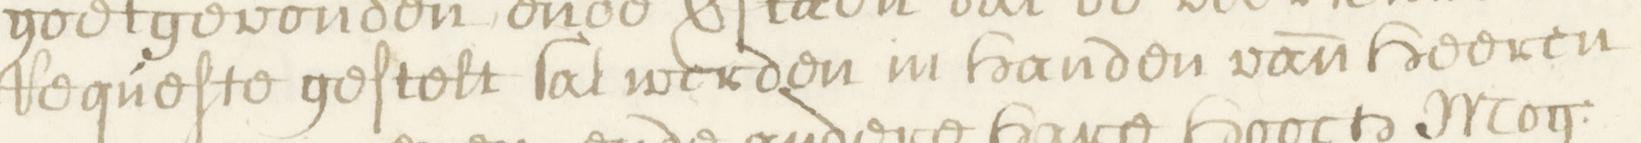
Requeste gestelt sal werden in handen van Heeren
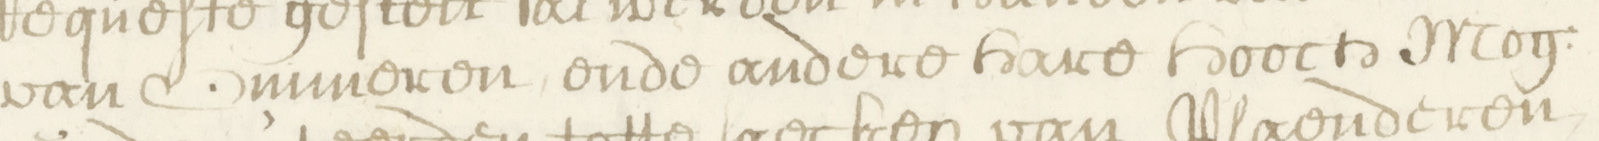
van Ommeren, ende andere hare Hooch Mog:
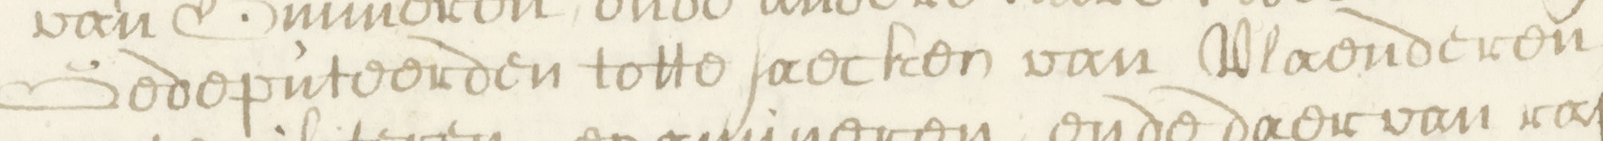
Gedeputeerden totte saecken van Vlaenderen
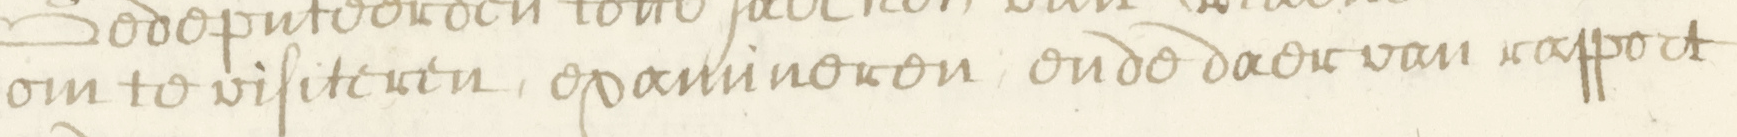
om te visiteren, examineren, ende daervan rapport
